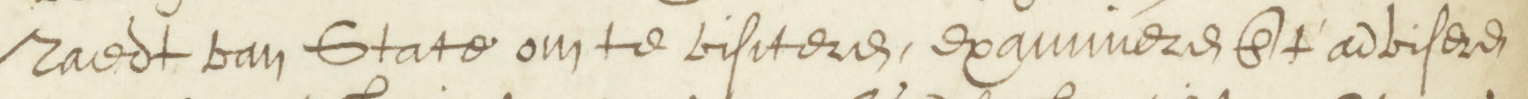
Raedt van State om te visiteren, examineren & t'adviseren
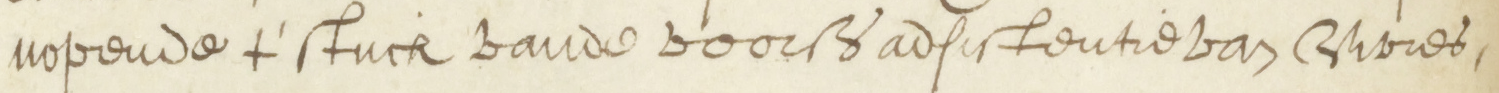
nopende t‛stuck vande voors adsistentie van Vivres.
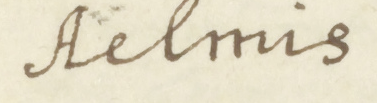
Aelmis.
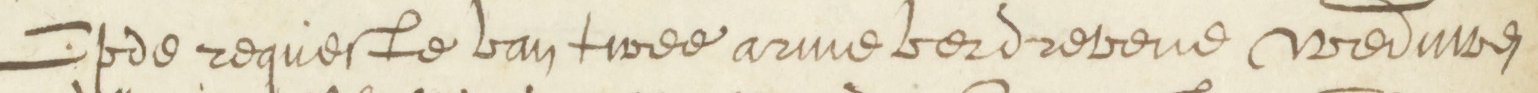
Opde requeste van twee arme verdrevene weduwen
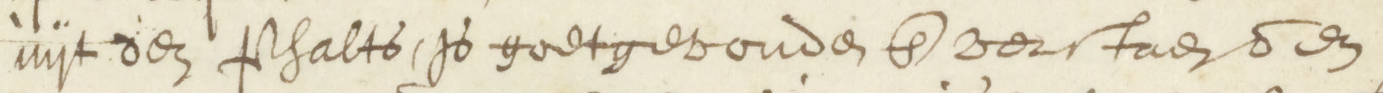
uijt den Phalts, Is goetgevonden & verstaen den
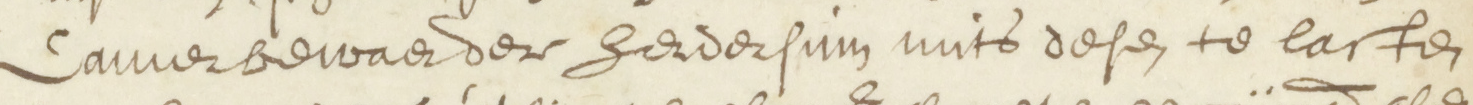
Camerbewaerder herdersum mits desen te lasten
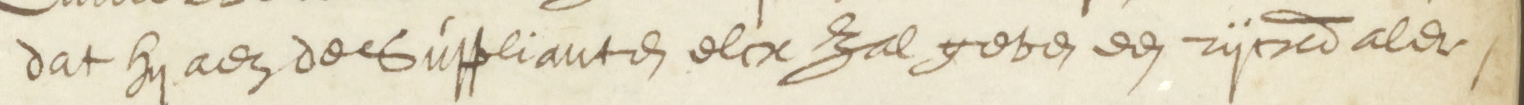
dat hy aen de Supplianten elcx zal geven een rijcxdaler.
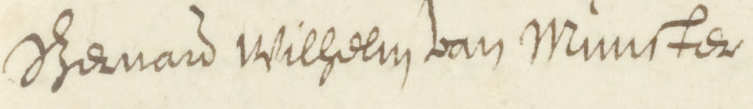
Bernard Wilhelm van Munster
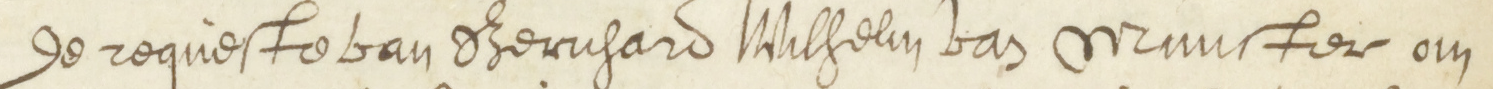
De requeste van Bernhard Wilhelm van Munster om
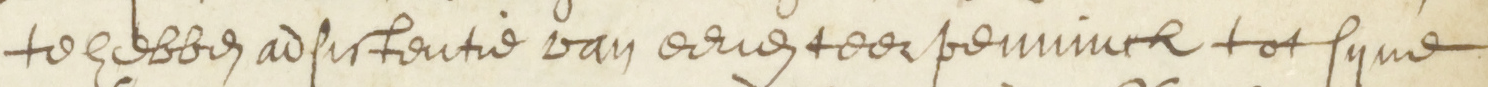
te hebben adsistentie van eenen teerpenninck tot syne
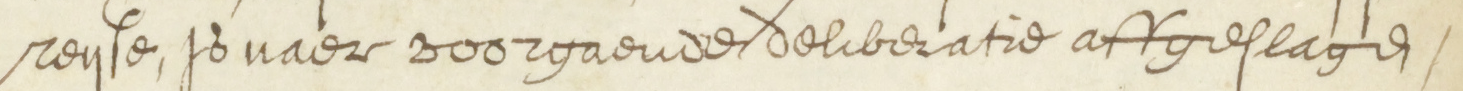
reyse, is naer voorgaende deliberatie affgeslagen.
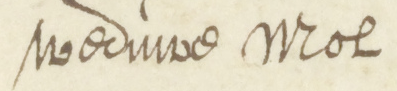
weduwe Mol
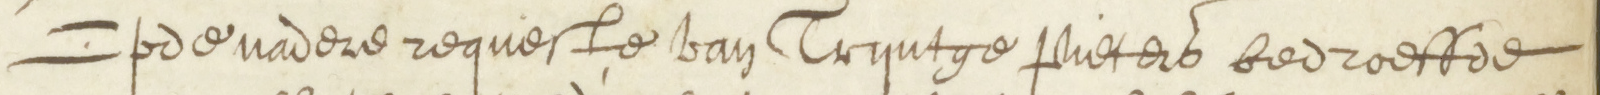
Opde nadere requeste van Tryntge Pieters bedroeffde
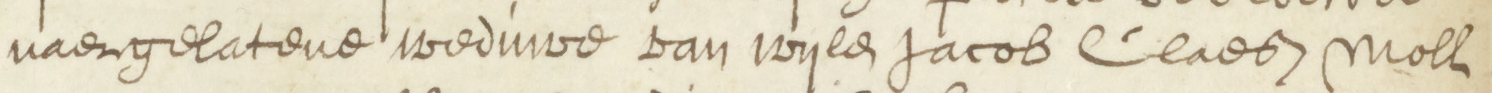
naergelatene weduwe van wylen Jacob Claes Moll
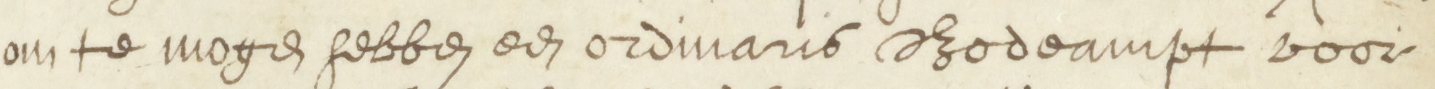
om te mogen hebben een ordinaris Bodeampt voor
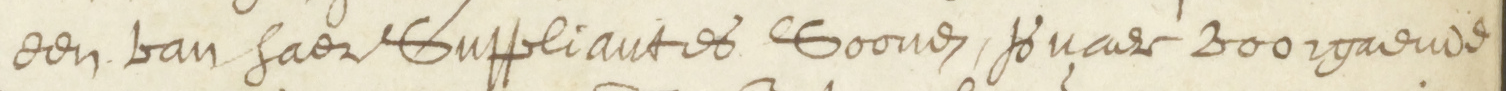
een van haer Suppliantes Soonen, Is naer voorgaende
